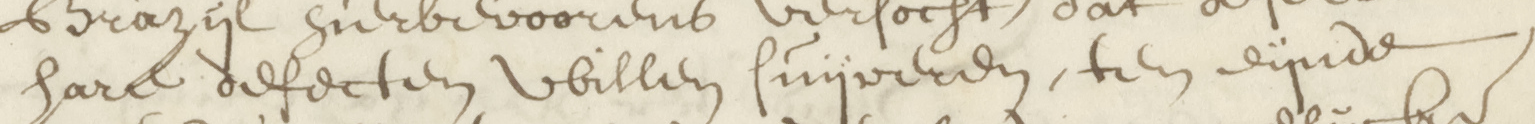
hare defecten willen suijveren, ten eijnde
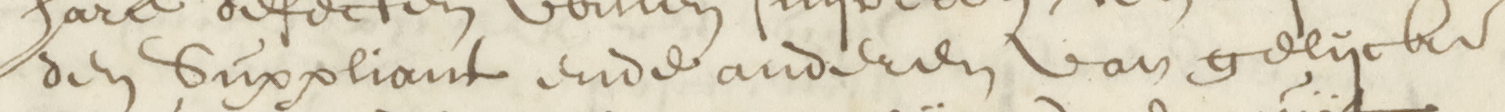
den Suppliant ende anderen van gelijcke
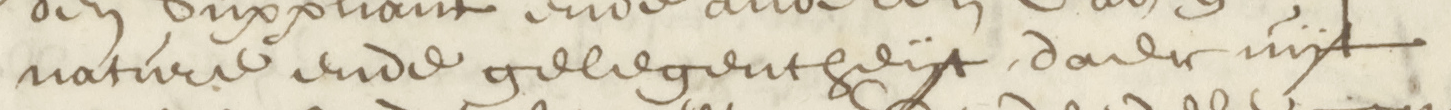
nature ende gelegentheijt, daer uijt
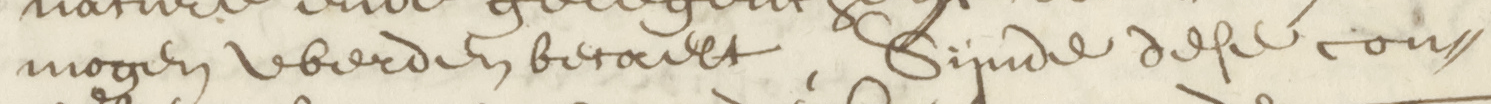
mogen werden betaelt, Sijnde dese con„
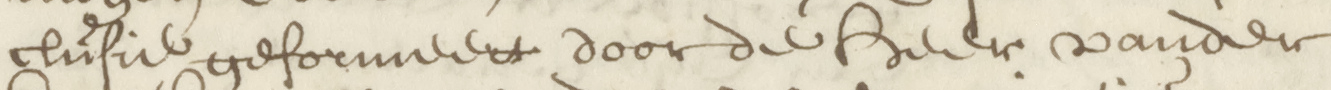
clusie geformeert door de Heer vander
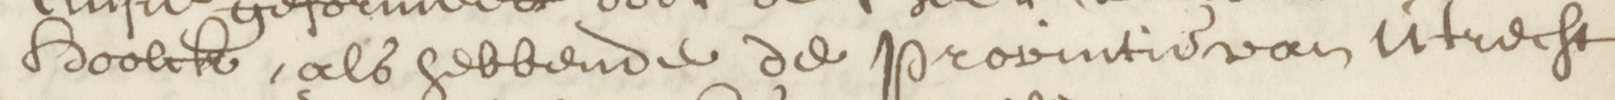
Hoolck, als hebbende de Provintie van Utrecht
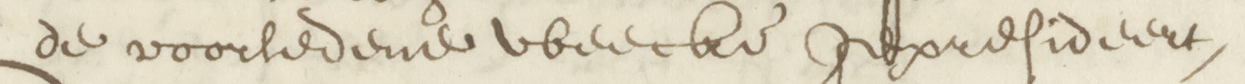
de voorledene weecke gepresideert.
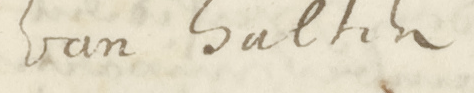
van Halten
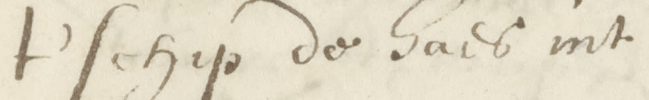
t‛schip de Haes int
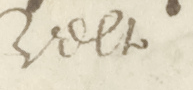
Velt.
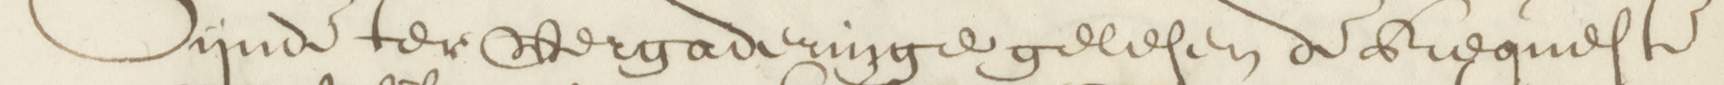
Sijnde ter Vergaderinge gelesen de Requeste
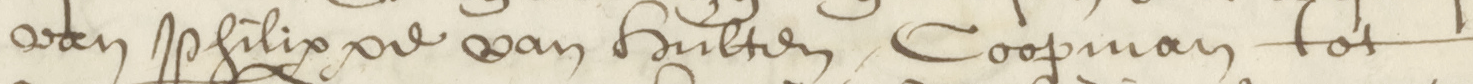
van Philippe van Hulten, Coopman tot
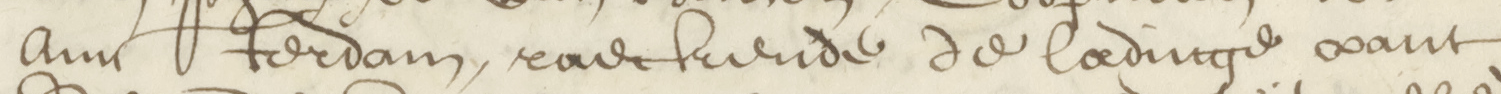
Amsterdam, raeckende de ladinge vant
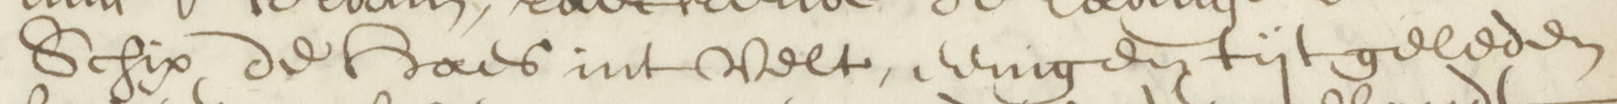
Schip de Haes int Velt, eenigen tijt geleden
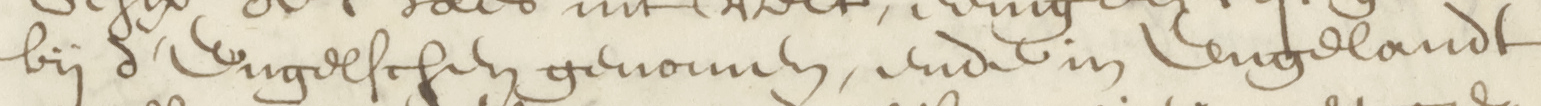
bij d‛Engelschen genomen, ende in Engelandt
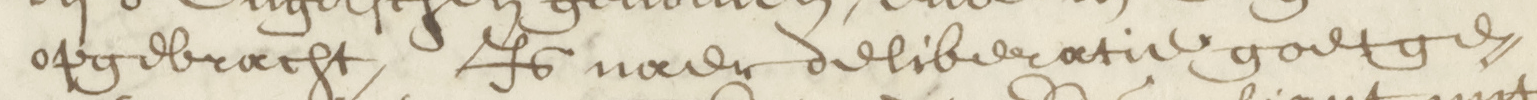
opgebracht, Is naer deliberatie goetge„
